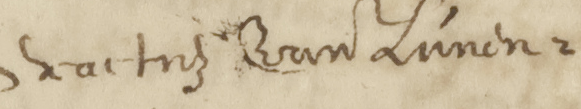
Exactien van Lunen„
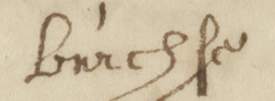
burchse
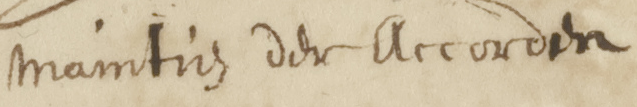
maintien der Accorden
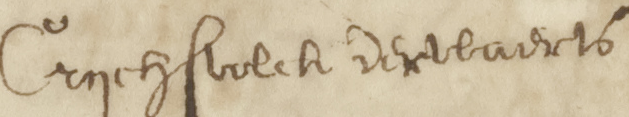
Crijchsvolck derwaerts
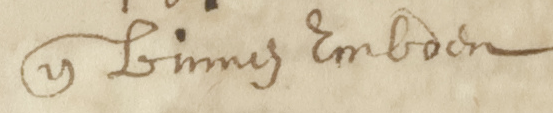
& binnen Embden
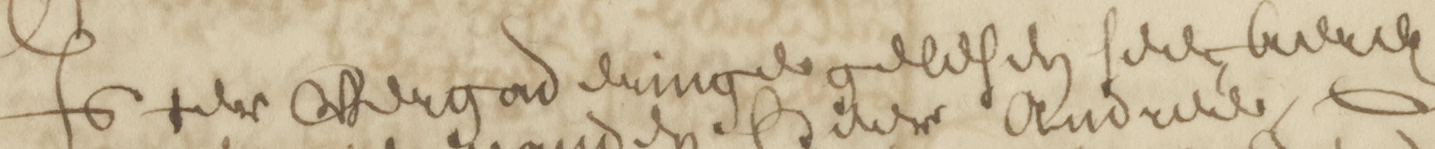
Is ter Vergaderinge gelesen seeckere
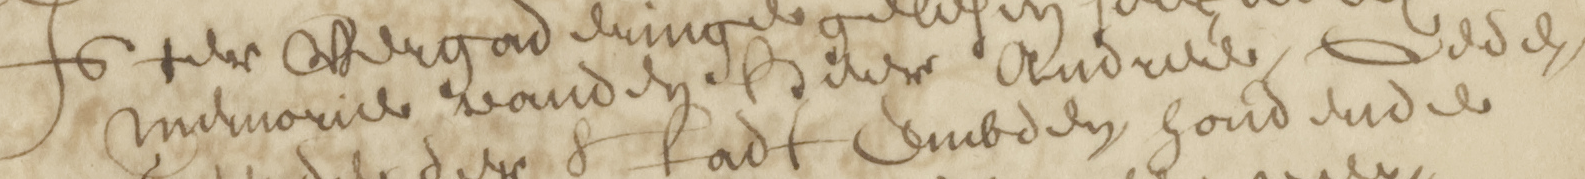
Memorie vanden Heere Andree, Gede„
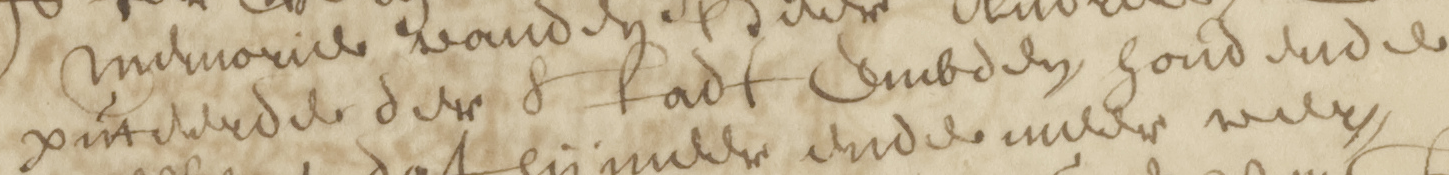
puteerde der Stadt Embden, houdende
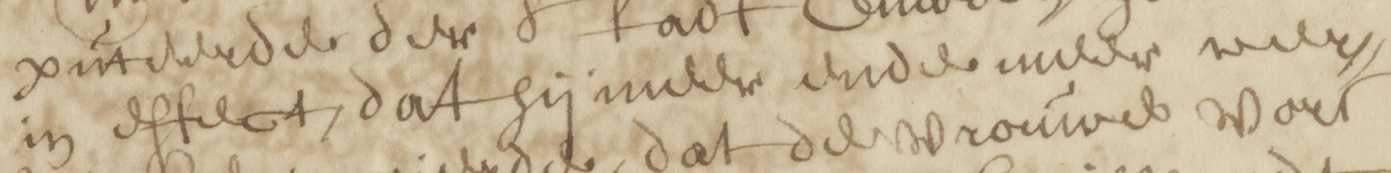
in effect, dat hij meer ende meer ver„
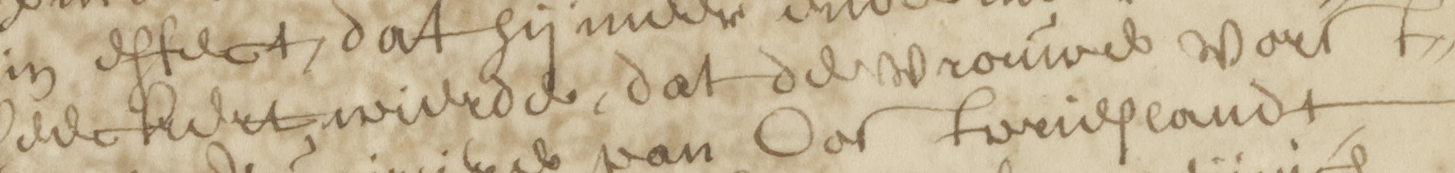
seeckert wierde, dat de Vrouwe Vorst„
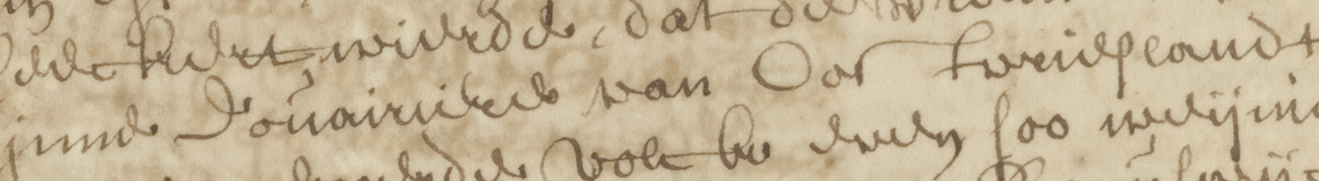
inne Douairiere van Oostvrieslandt,
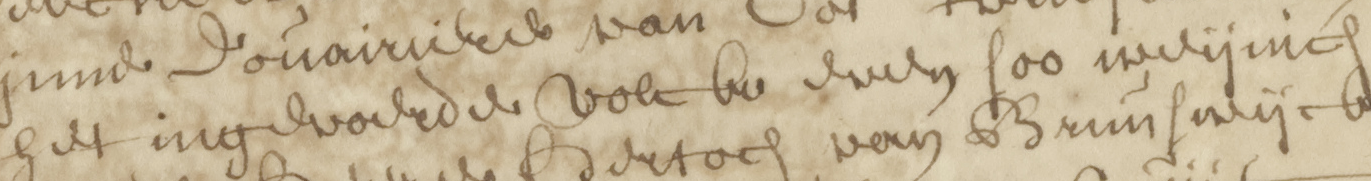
het ingevoerde volck even soo weijnich
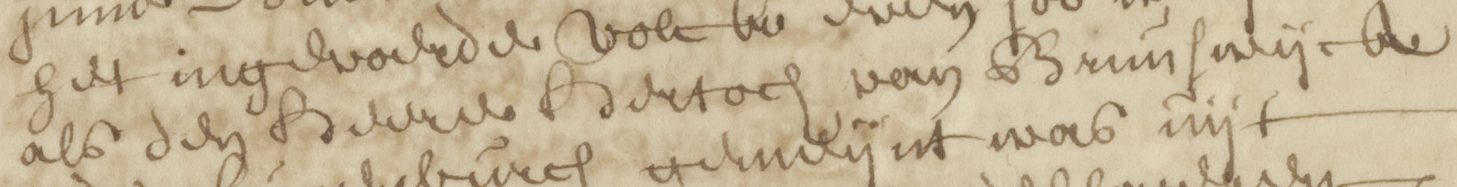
als den Heere Hertoch van Brunswijck
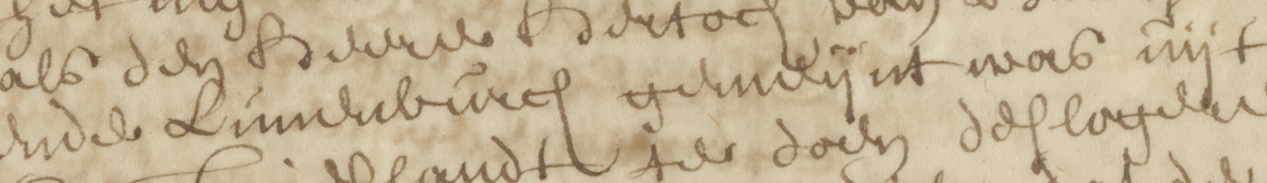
ende Lunenburch gemeijnt was uijt
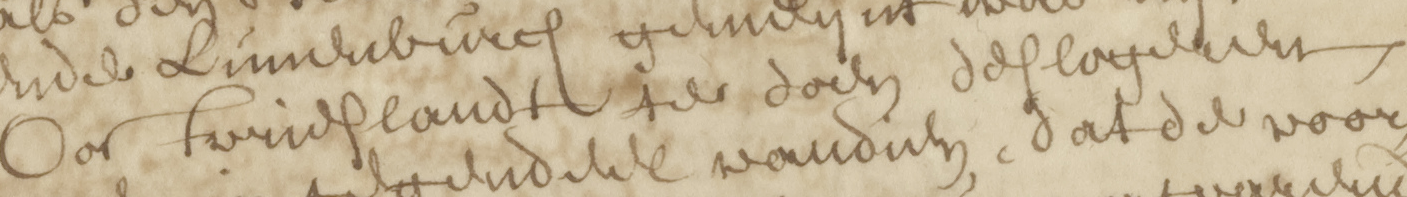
Oostvrieslandt te doen deslogeren,
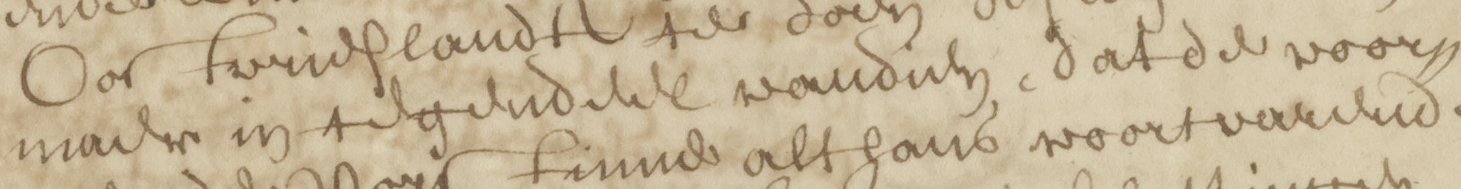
maer in tegendeel vandien, dat de voor„
